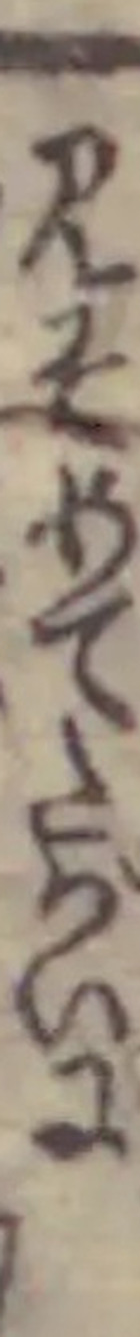見そめてたがいに
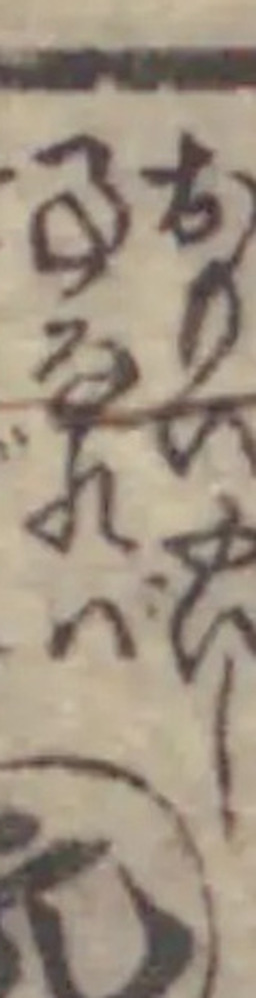事なれば
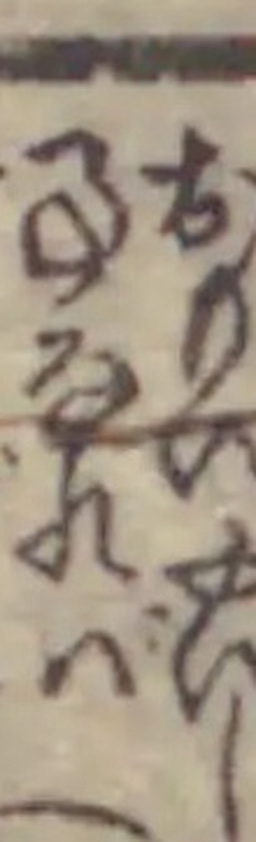事なれば
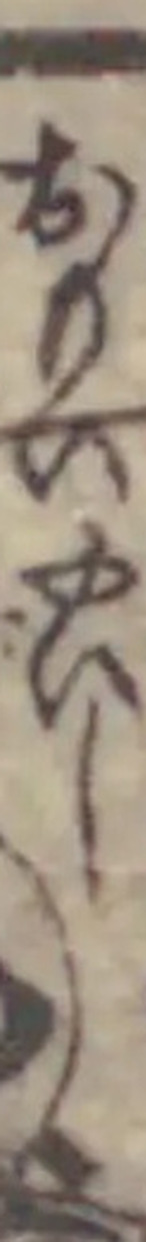おもいやいし
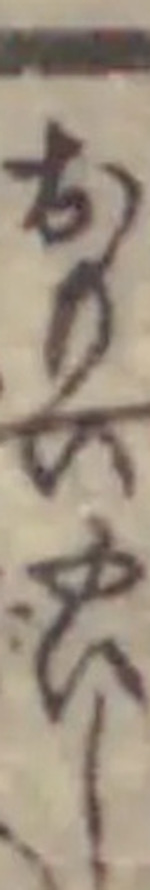おもいやいし
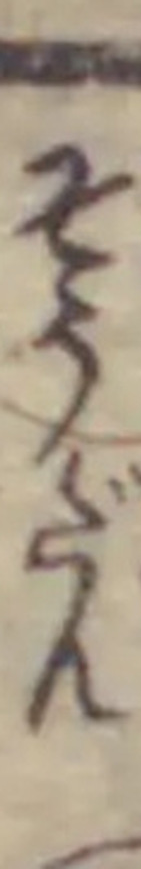そうだん
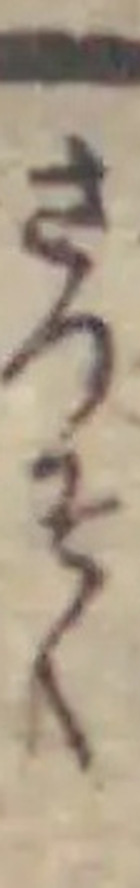さつそく
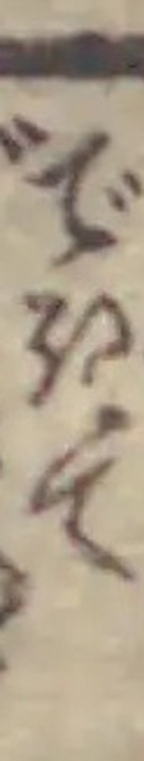できて
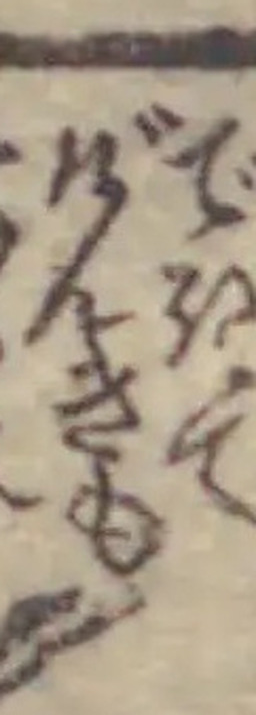げんきも
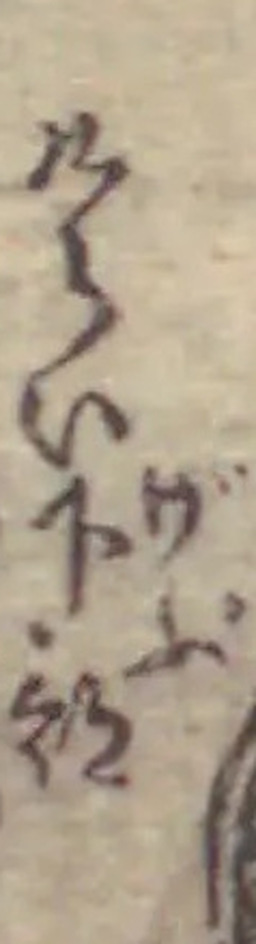けらい下部
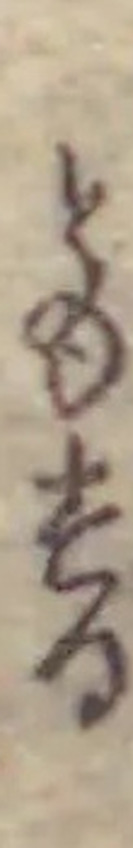ともする
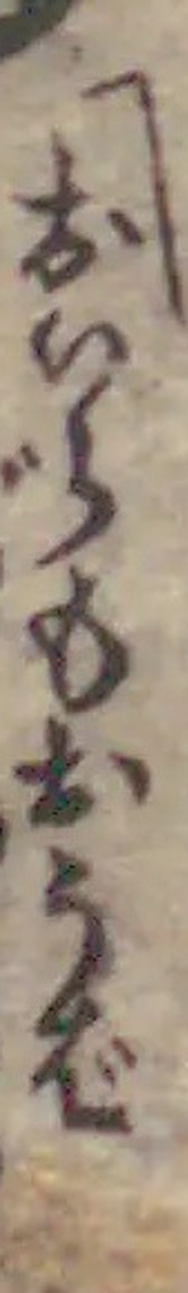〽おいらもおうば
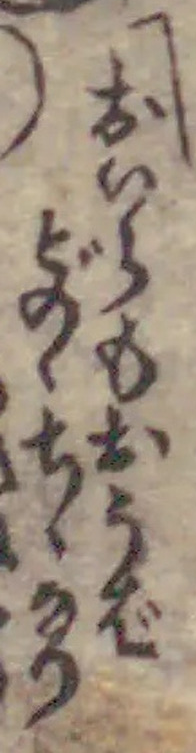〽おいらもおうば
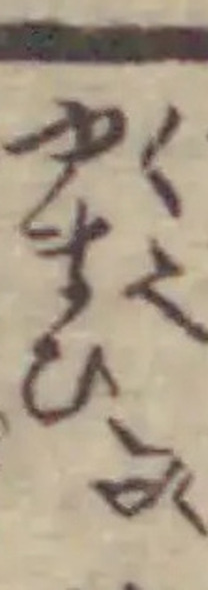やまひ
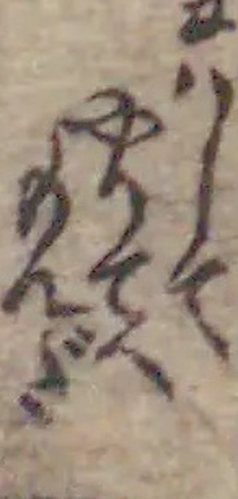やりてへ
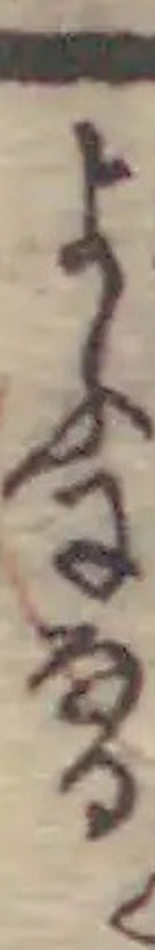よふになる
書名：腹内養生主論 3巻
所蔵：国立国会図書館 National Diet Library, JAPAN
